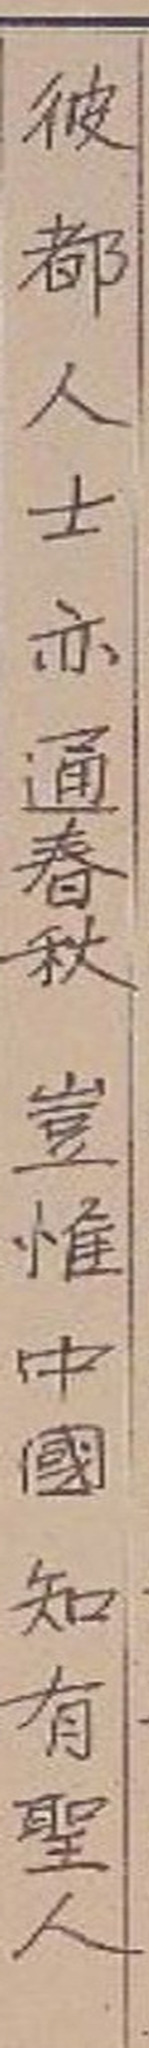彼都人士亦通春秋豈惟中国知有聖人
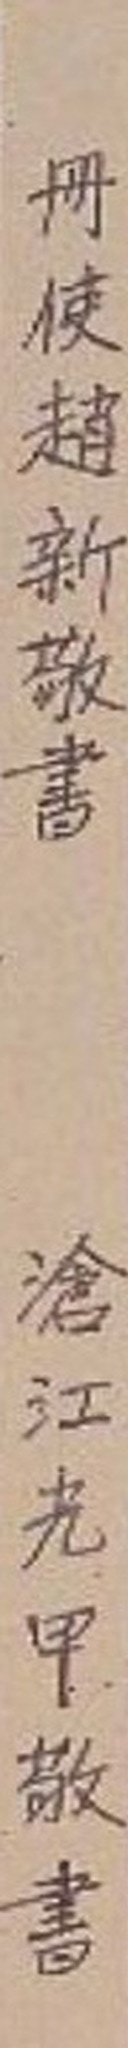冊使趙新敬書滄江光甲敬書
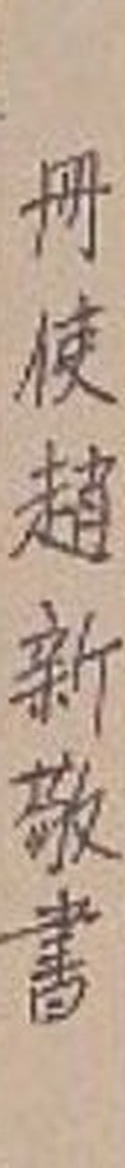冊使趙新敬書

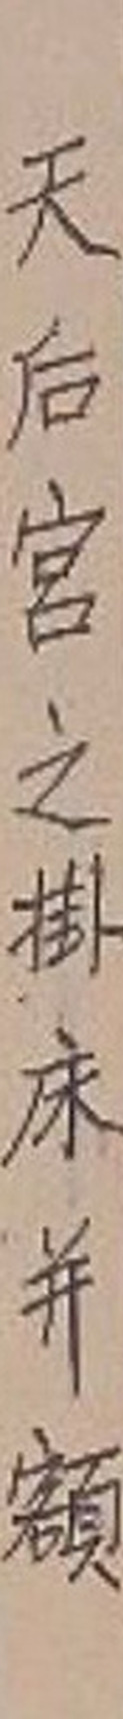天后宮之掛床并額
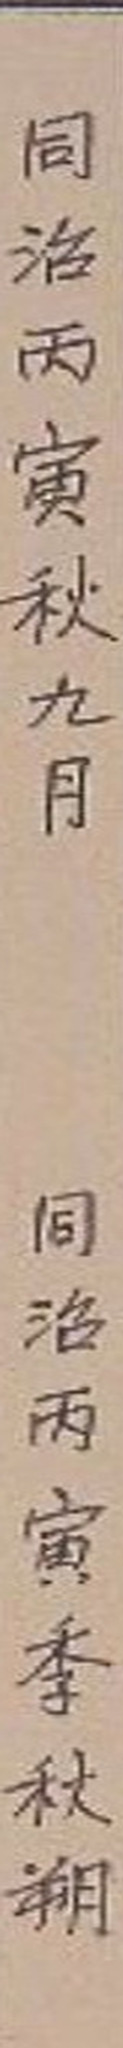同治丙寅秋九月同治丙寅季秋朔
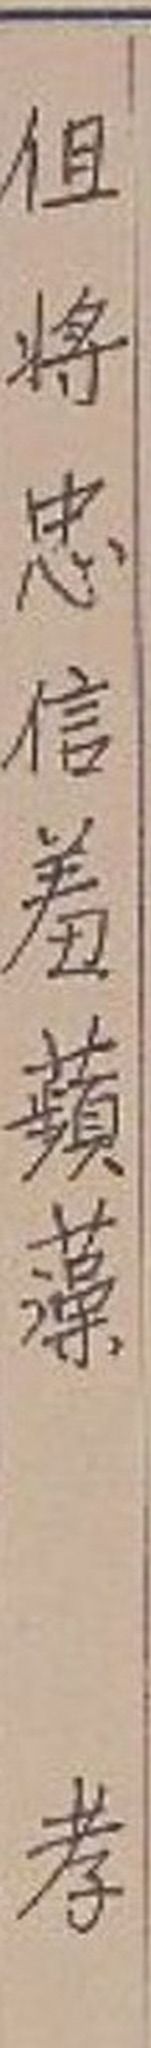但将忠信羞蘋藻孝
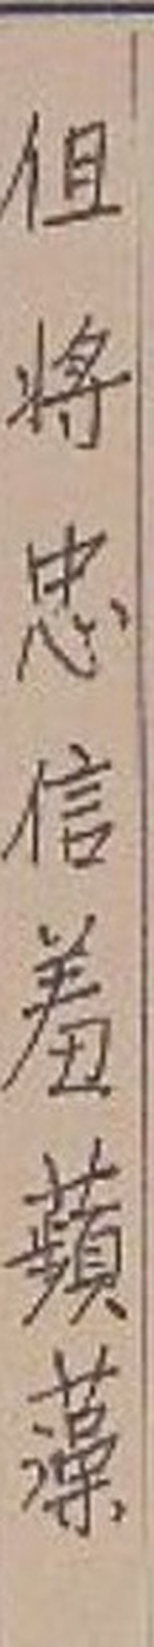但将忠信羞蘋藻孝
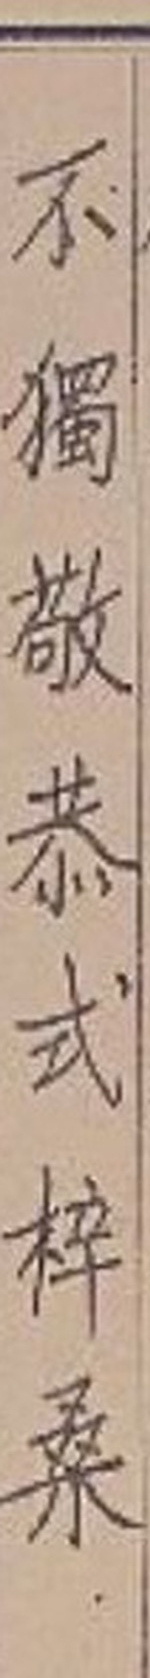不独敬恭式梓桑慈
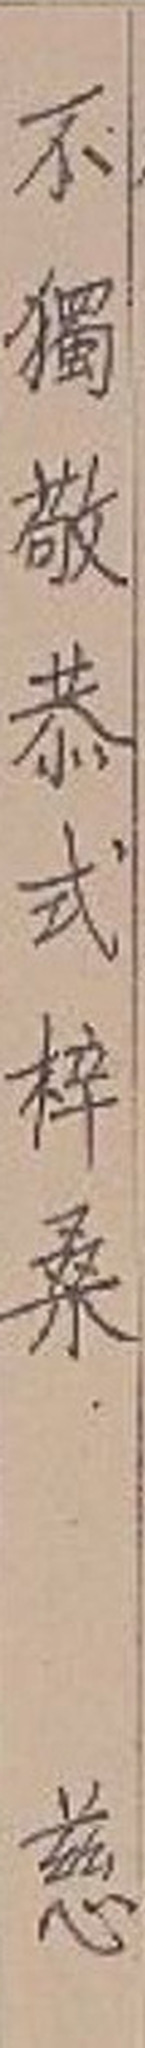不独敬恭式梓桑慈
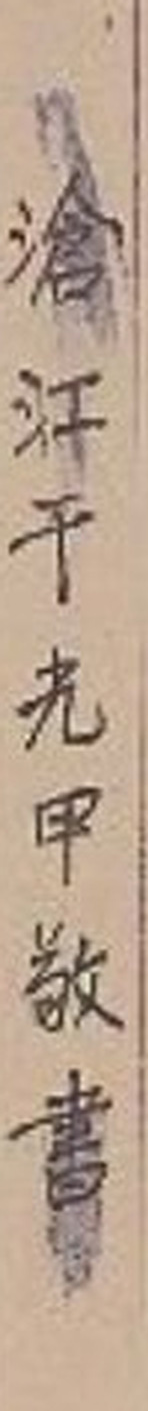滄江干光甲敬書
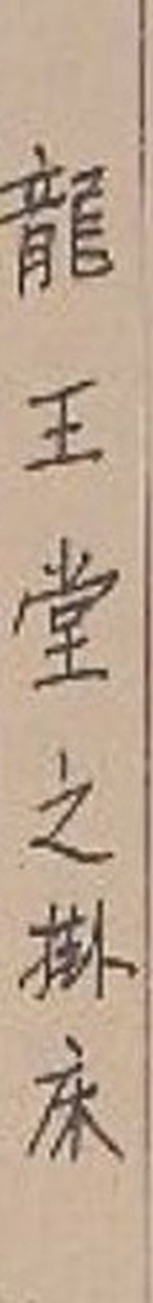龍王堂之掛床
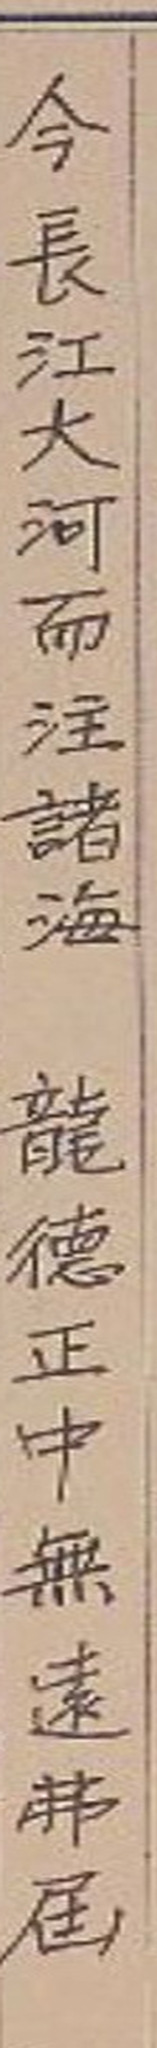今長江大河而注諸海龍徳正中無遠弗届
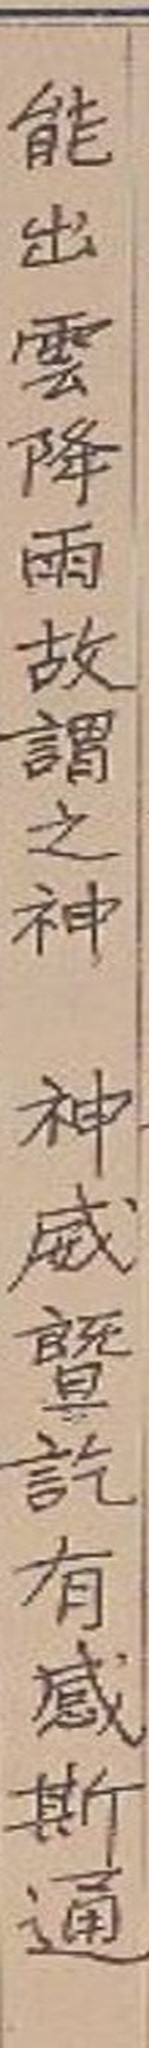能出雲降雨故謂之神神威曁訖有感斯通
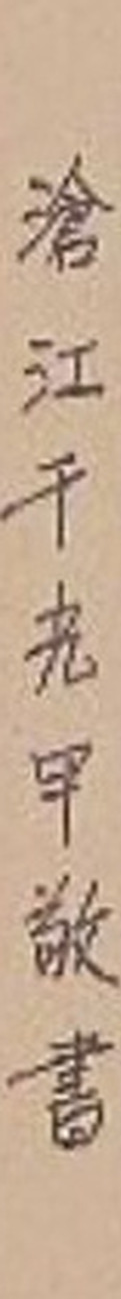滄江干光甲敬書
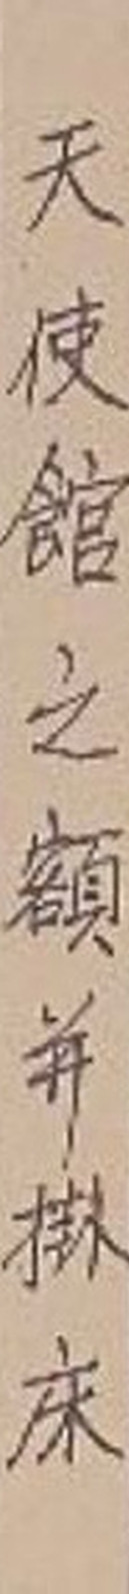天使館之額并掛床
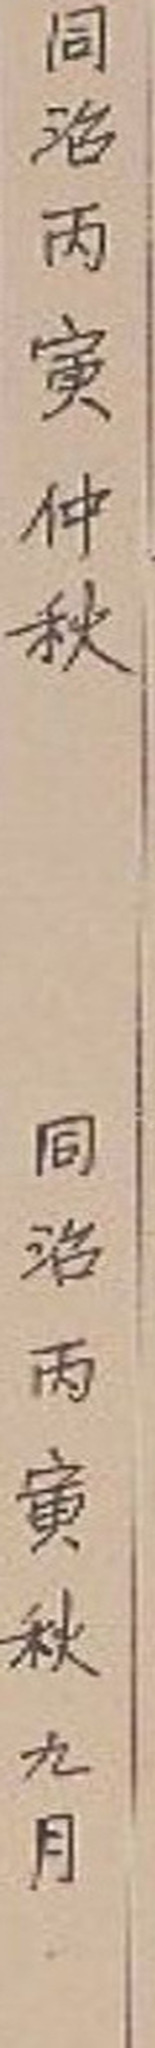同治丙寅仲秋同治丙寅秋九月
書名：支那冊封使来琉諸記 下巻
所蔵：University of the Ryukyus Library
